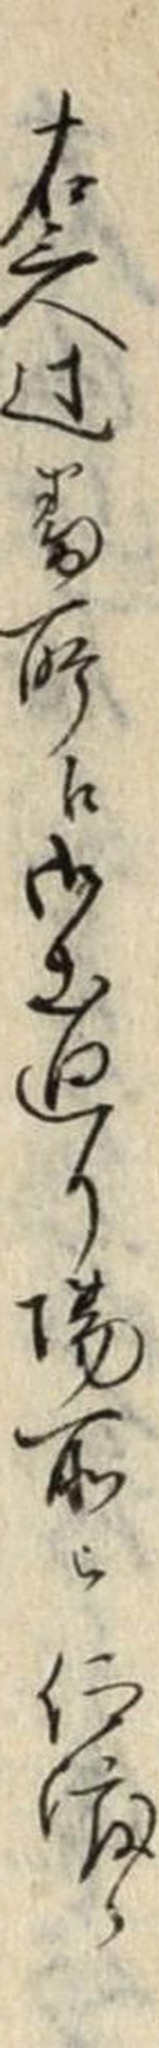右三人辻番所江御出廻り場所被仰渡候
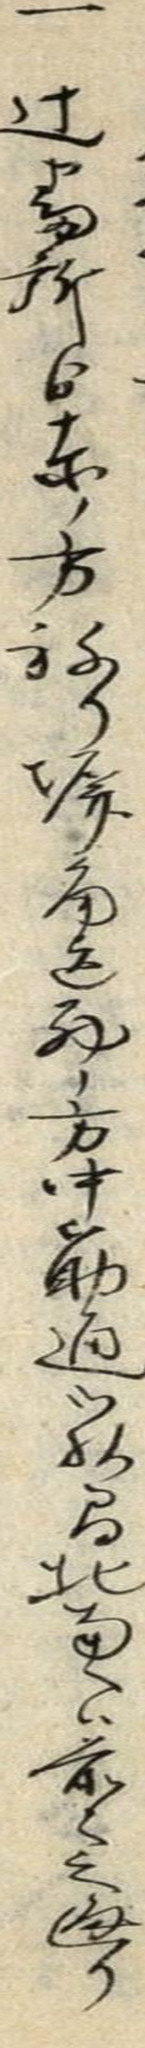一辻番所ゟ東の方ねり塀角迄西の方中筋通弐拾間北南へは前々之通り
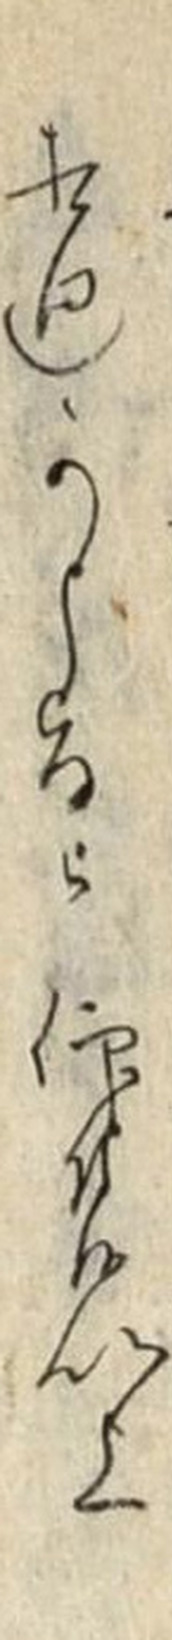相廻可申旨被仰付候以上
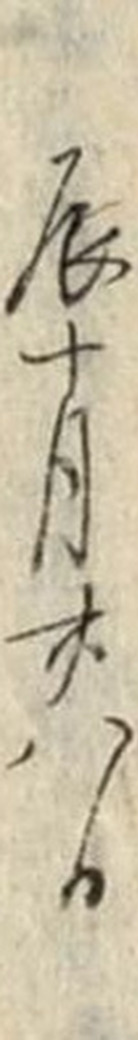辰十月廿八日
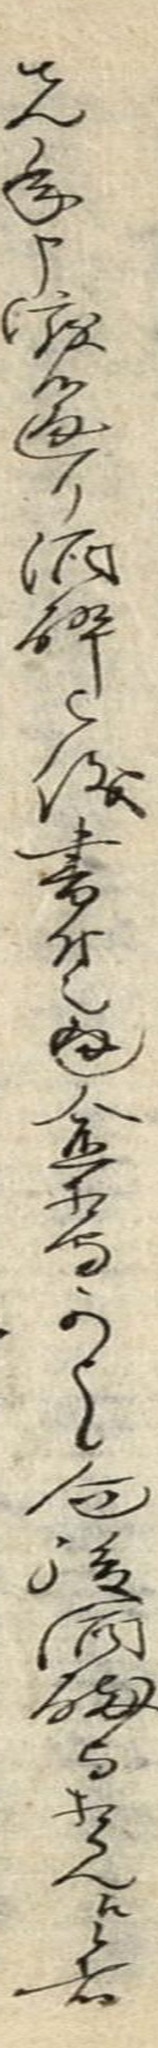先年申渡候通り酒酔之儀書付之通愈相守可申候向後酒酔と相見江候者
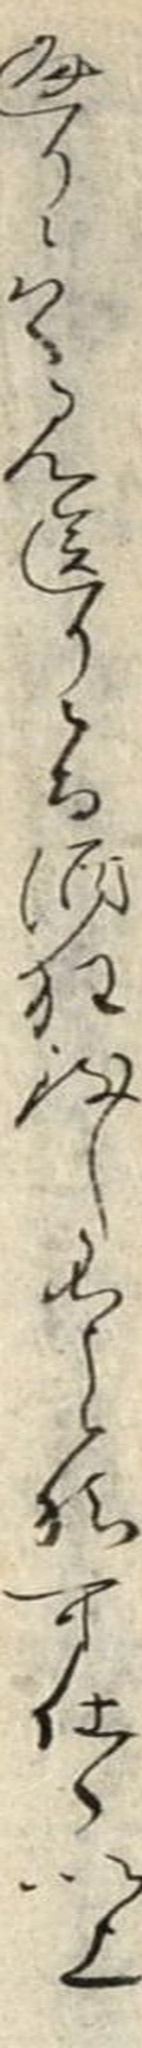通り候はゝ見送り候て酒狂致し不申候様可仕候以上
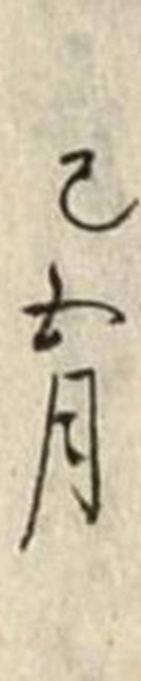巳五月
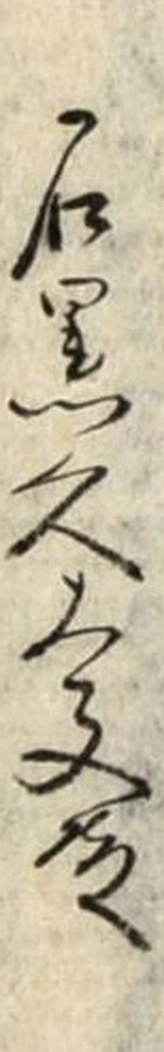覚石黒久大夫殿
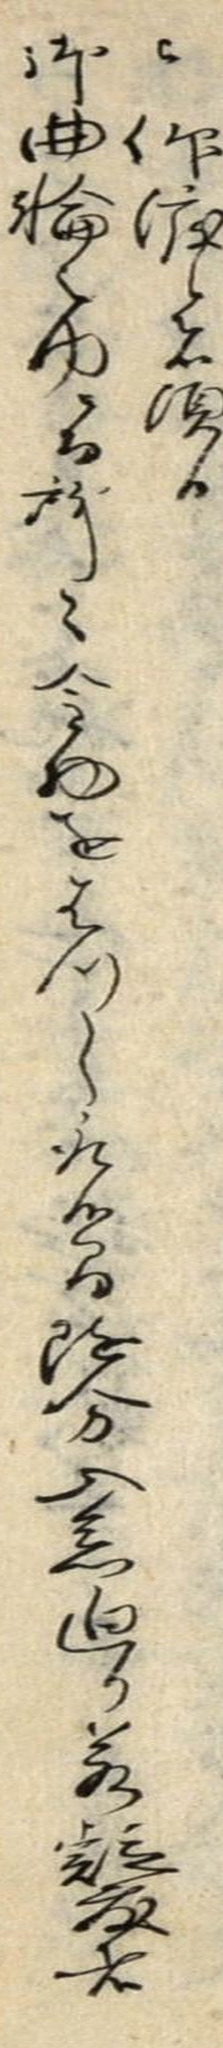御曲輪之内にて所々金物をはつし取候間随分入念廻り若疑敷者

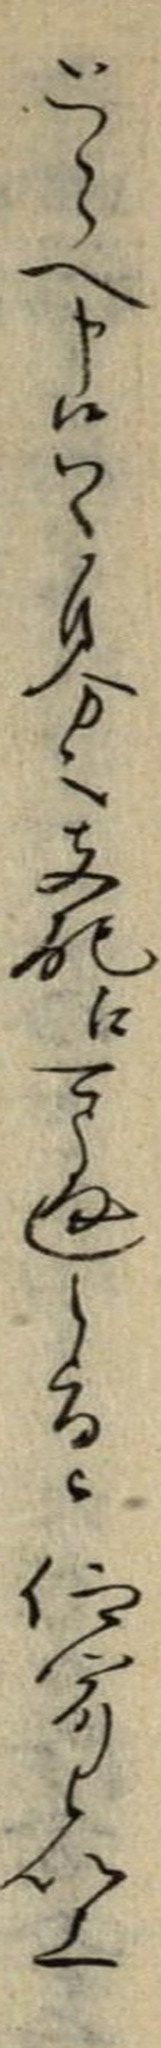とらへ申候はゝ自分之支配江可申通候旨被仰聞候以上
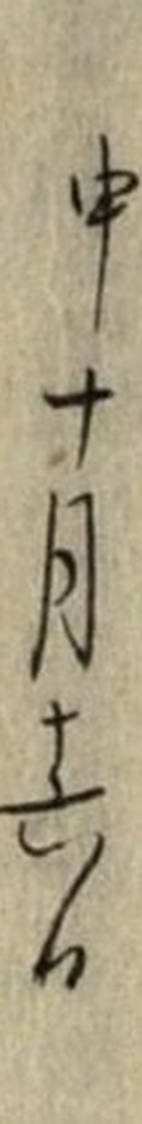申十月十六日
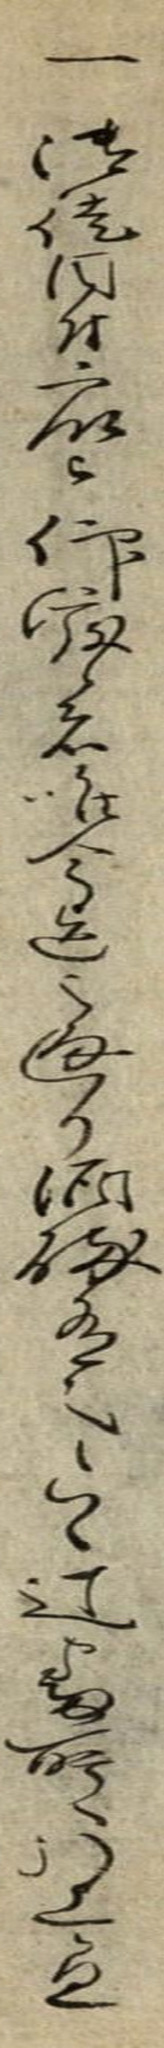一御徒目付衆被仰渡候は唯今迄之通り酒酔有之候はゝ辻番所へ引上置
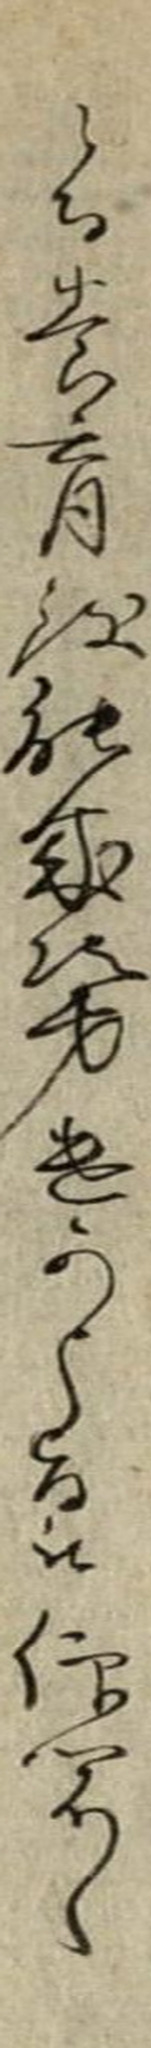候て養育致能成次第遣可申旨被仰聞候
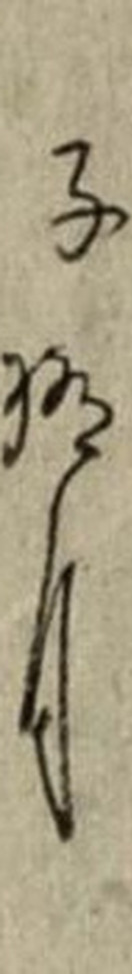子極月
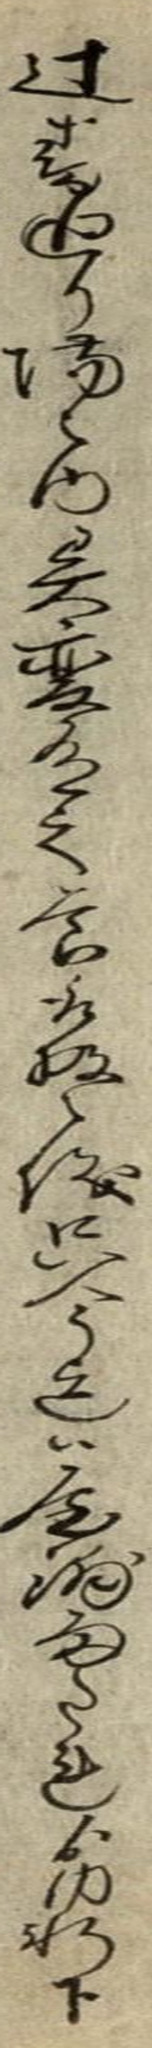辻番廻り場之内異変有之節取扱之儀只今迄は屋鋪雨たれゟ内軒下
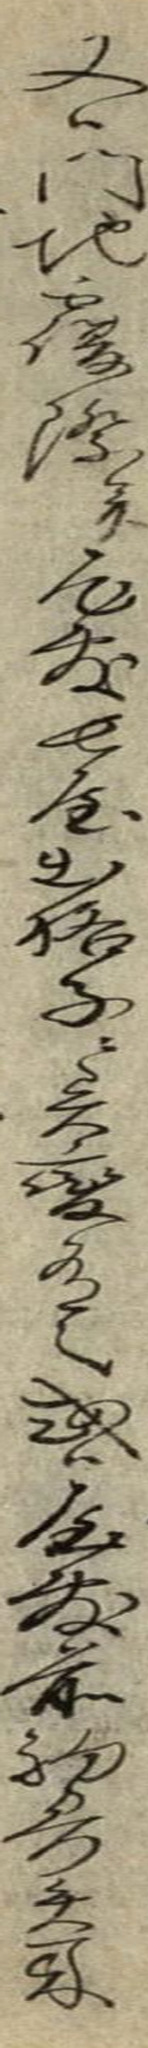又は門地覆際幷屋敷長屋出格子に異変有之或は屋敷前初寄矢来
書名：三都并道中之部
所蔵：福井県文書館 Fukui Prefectural Archives
